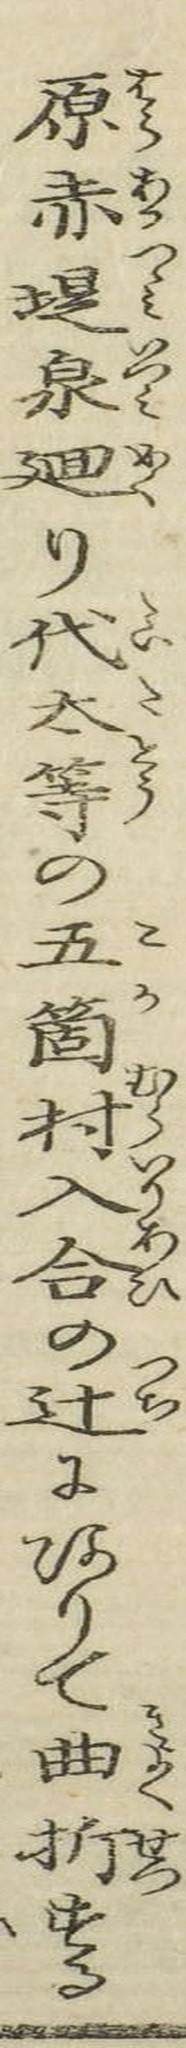原赤堤泉廻り代太等の五箇村入合の辻にありて曲折する
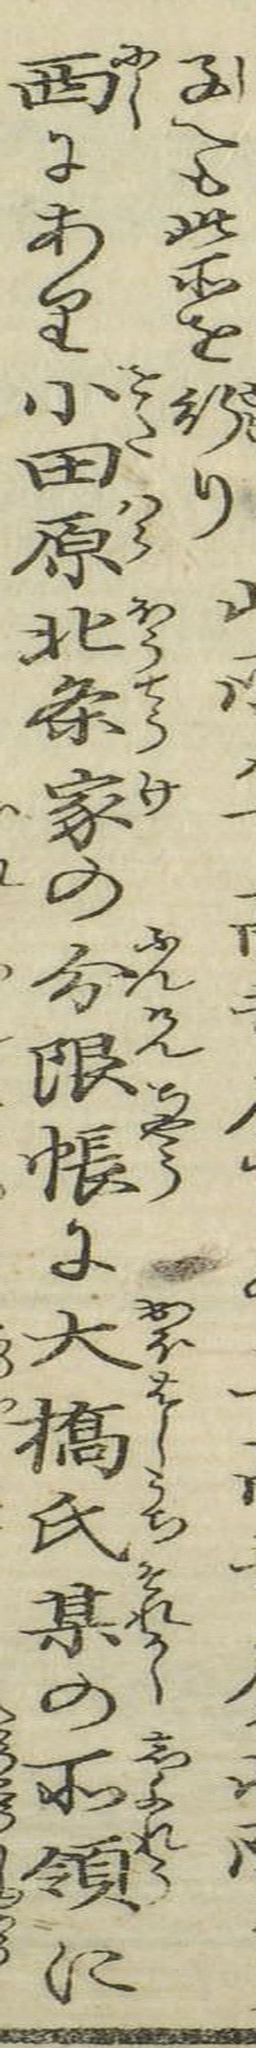西にあり小田原北条家の分限帳に大橋氏某の所領に

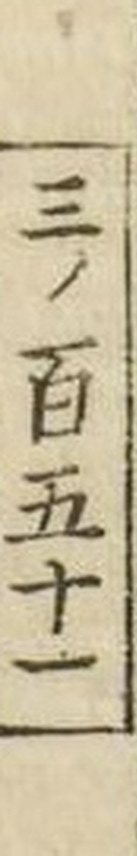三ノ百五十一

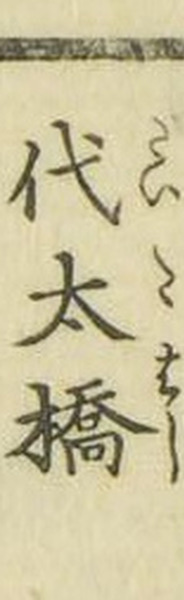代太橋
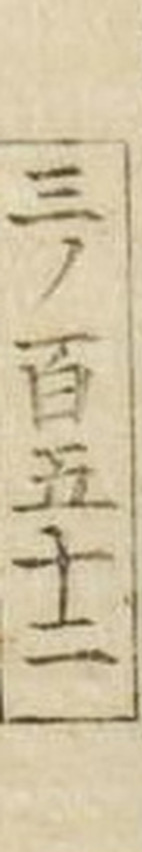三ノ百五十二
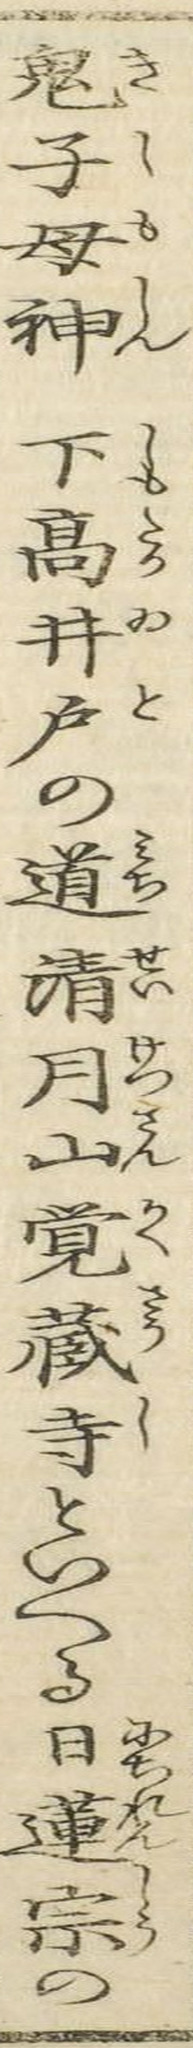鬼子母神下高井戸の道清月山覚蔵寺といへる日蓮宗の
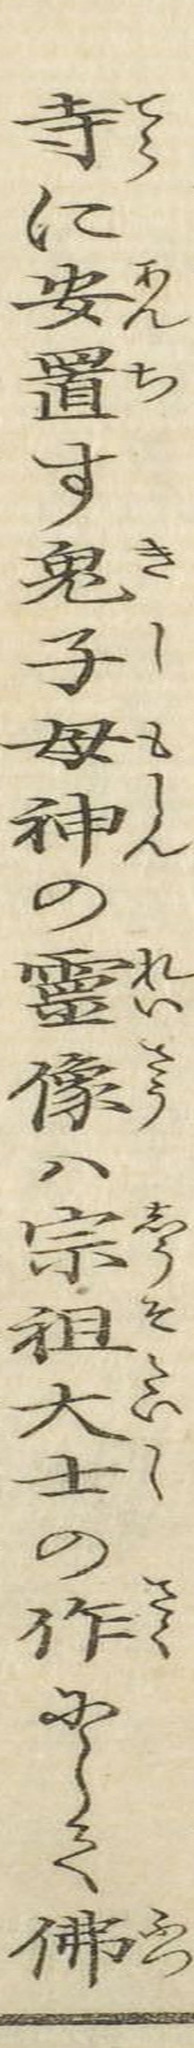寺に安置す鬼子母神の霊像は宗祖大士の作にして仏
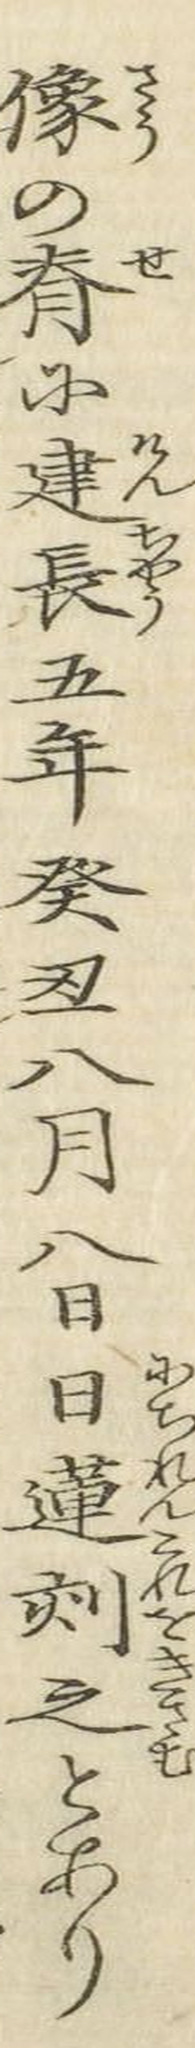像の脊に建長五年癸丑八月八日日蓮刻之とあり
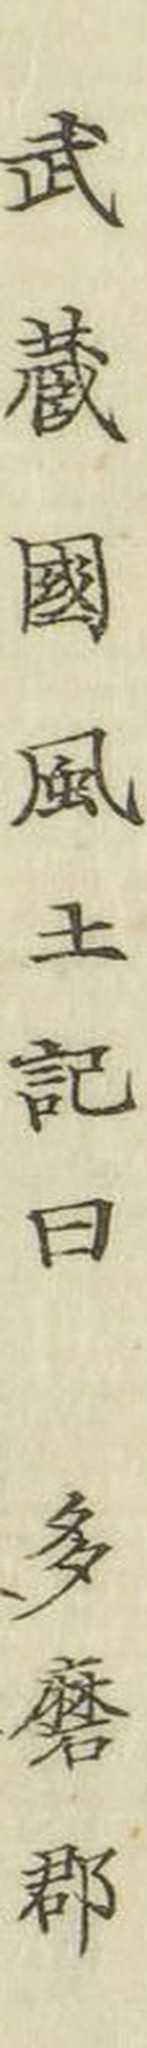武蔵国風土記曰多磨郡
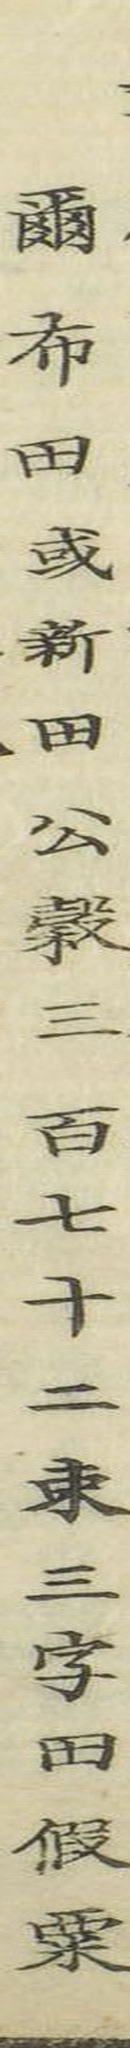爾布田或新田公穀三百七十二束三字田仮粟
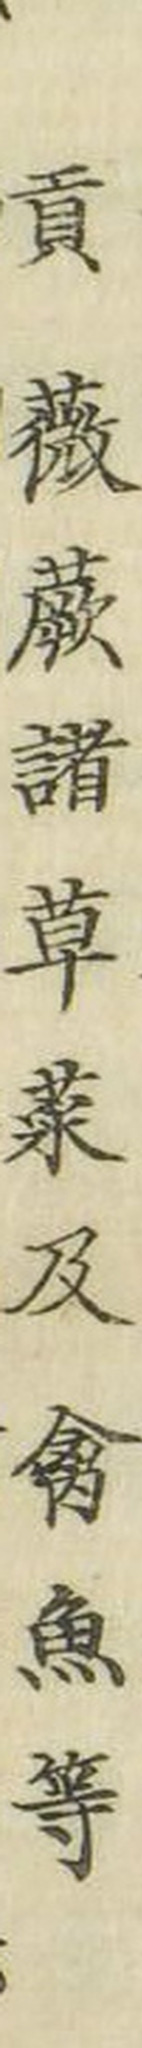貢薇蕨諸草菜及禽魚等
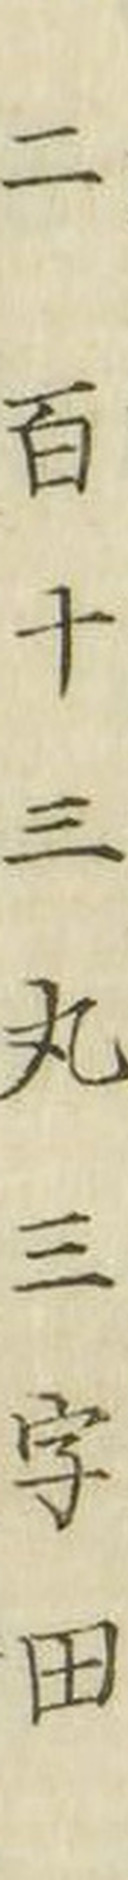二百十三丸三字田
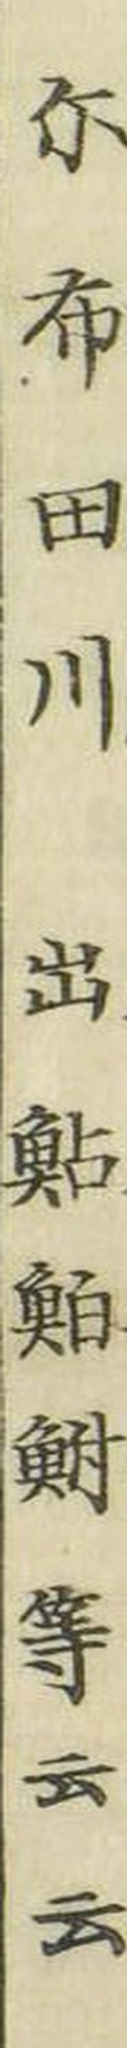尓布田川出鮎鮊鮒等云々

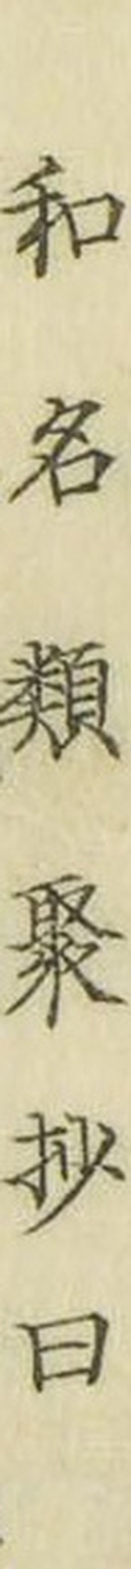和名類聚抄曰
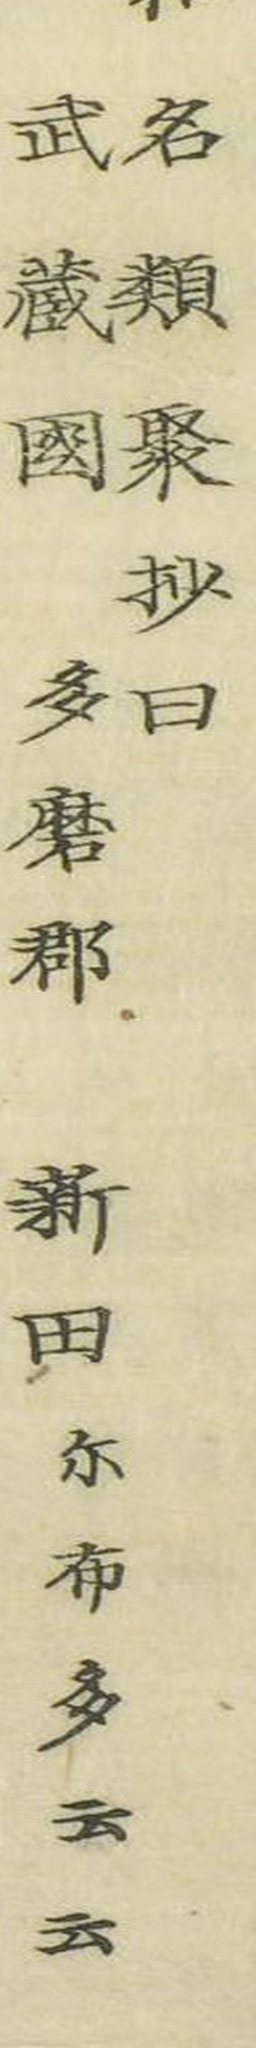武蔵国多磨郡新田尓布多云々
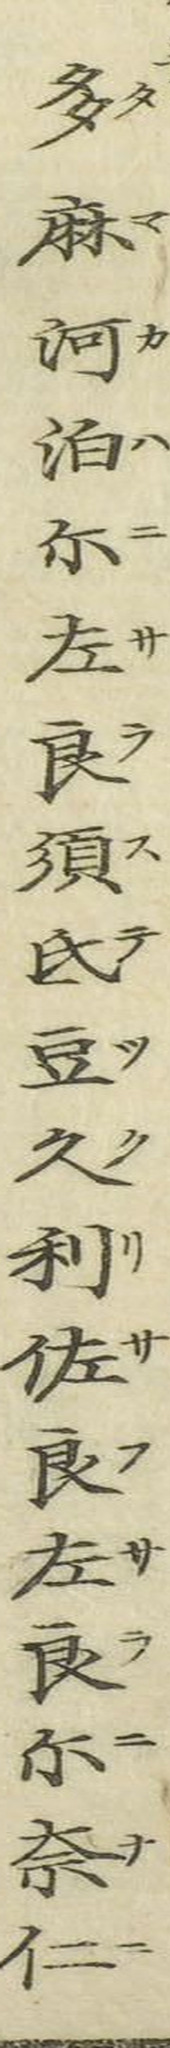多麻河泊尓左良須氐豆久利佐良左良尓奈仁
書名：江戸名所図会 20巻 巻之9
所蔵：東京学芸大学教育コンテンツアーカイブ
